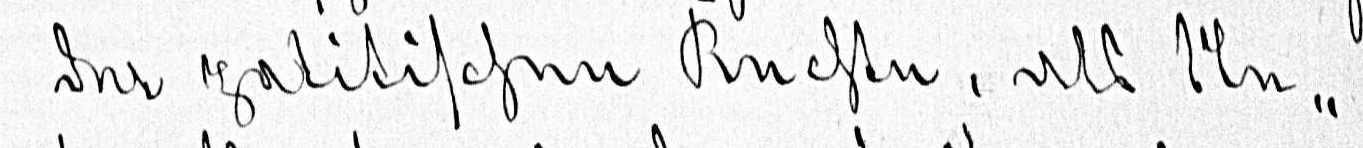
der politischen Rechte, als Ne
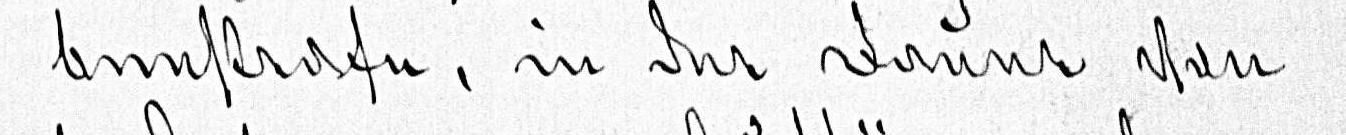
benstrafe, in der Dauer von
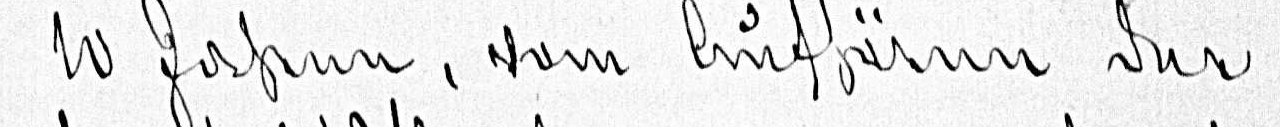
10 Jahren, vom Aufhören der
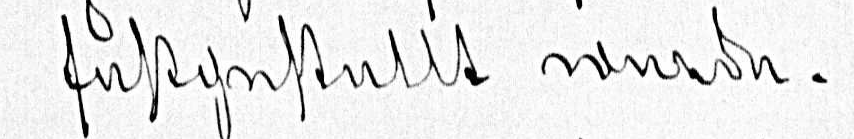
festgestellt werde.
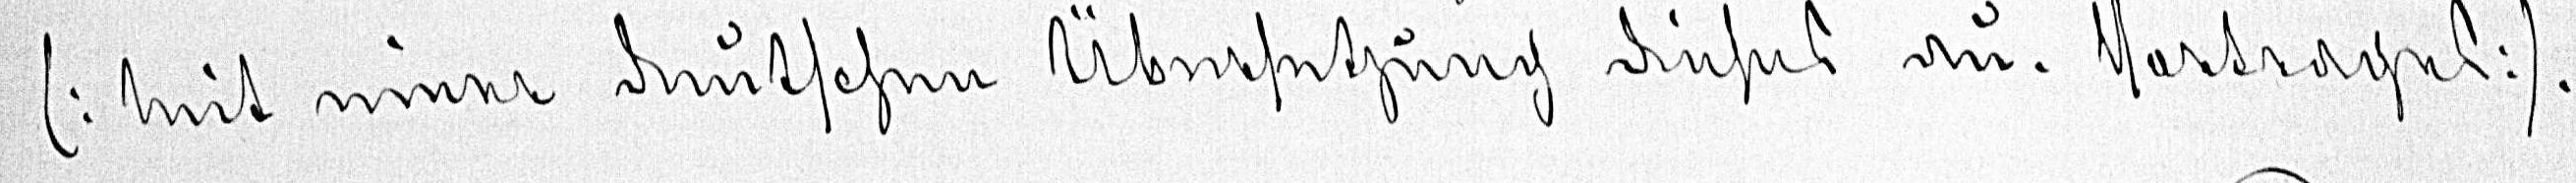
(Mit einer deutschen Übersetzung dieses au Vortrages.)
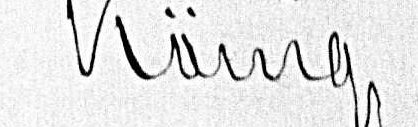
König
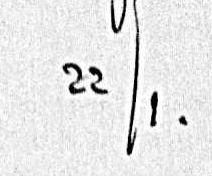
22/1
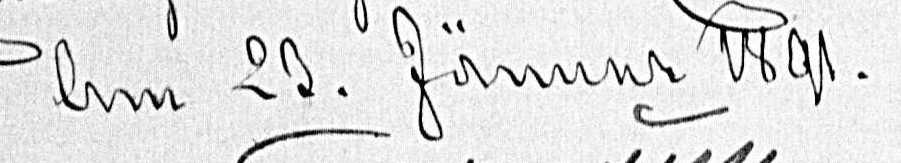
Am 23. Jänner 1891
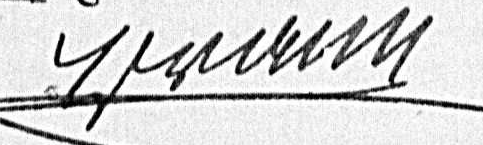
Braun
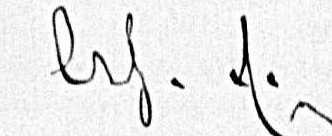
Ah. E.
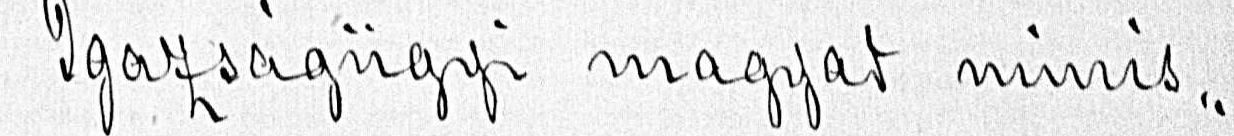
Igazsàgügyi magyar nimis
